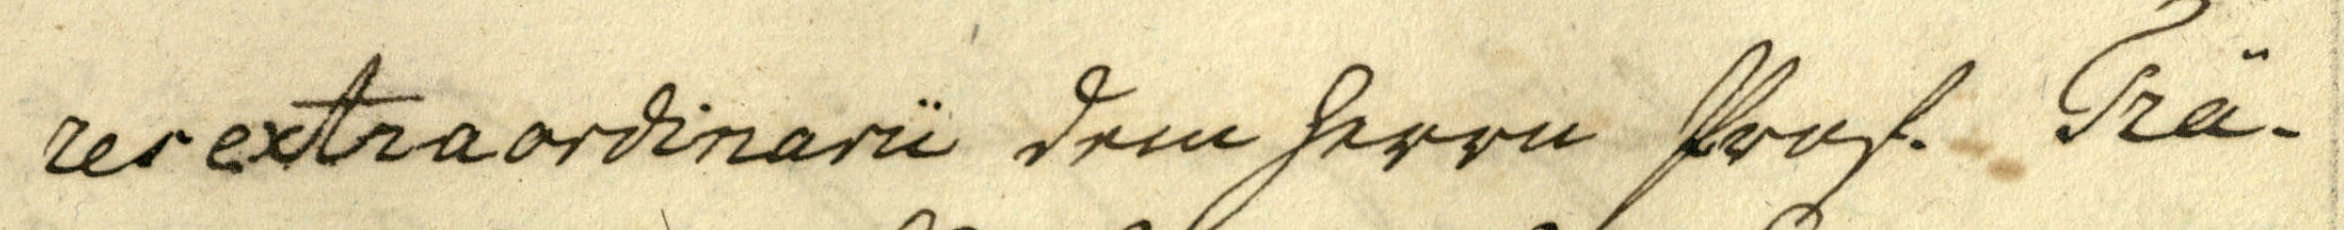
res extraordinarii dem Herrn Prof. Trä¬
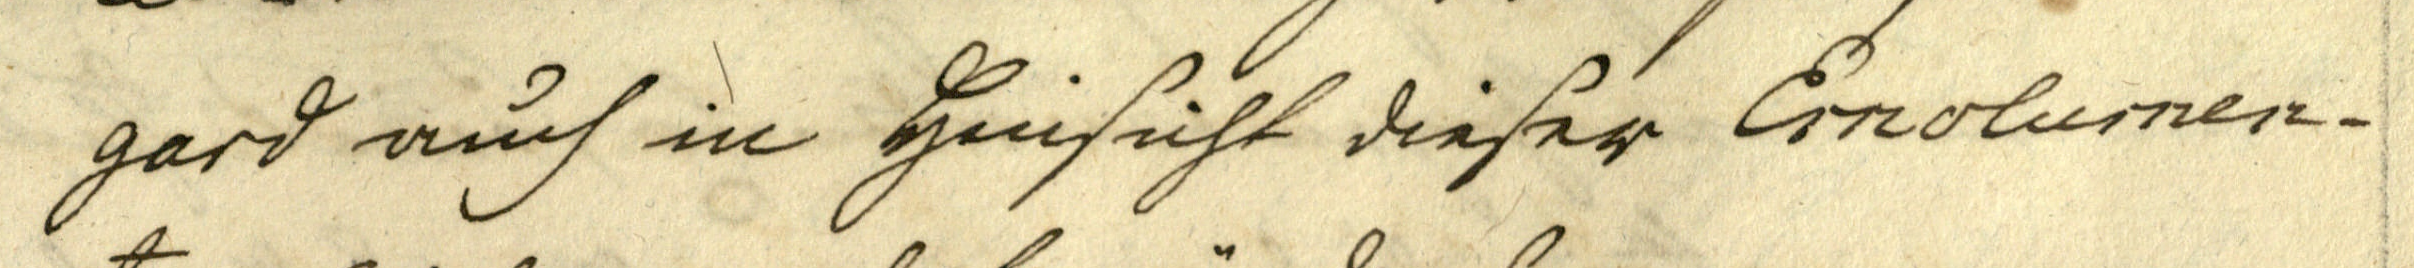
gard auch in Hinsicht dieser Emolumen-
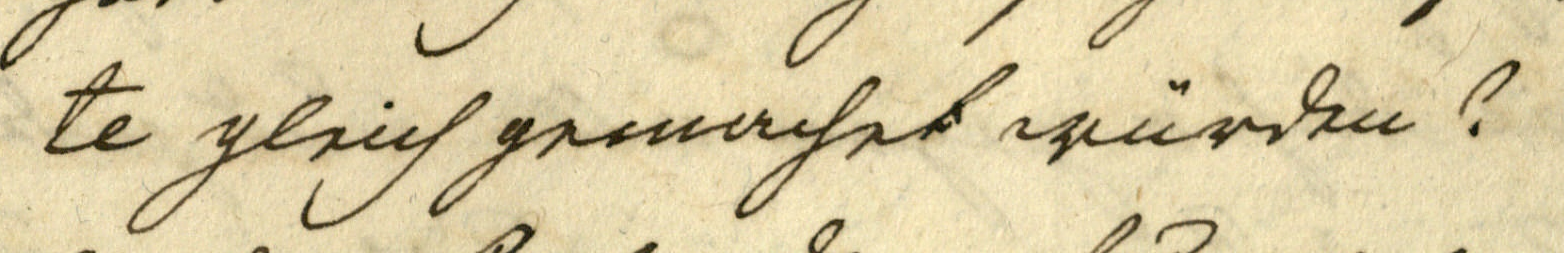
te gleich gemachet würden?
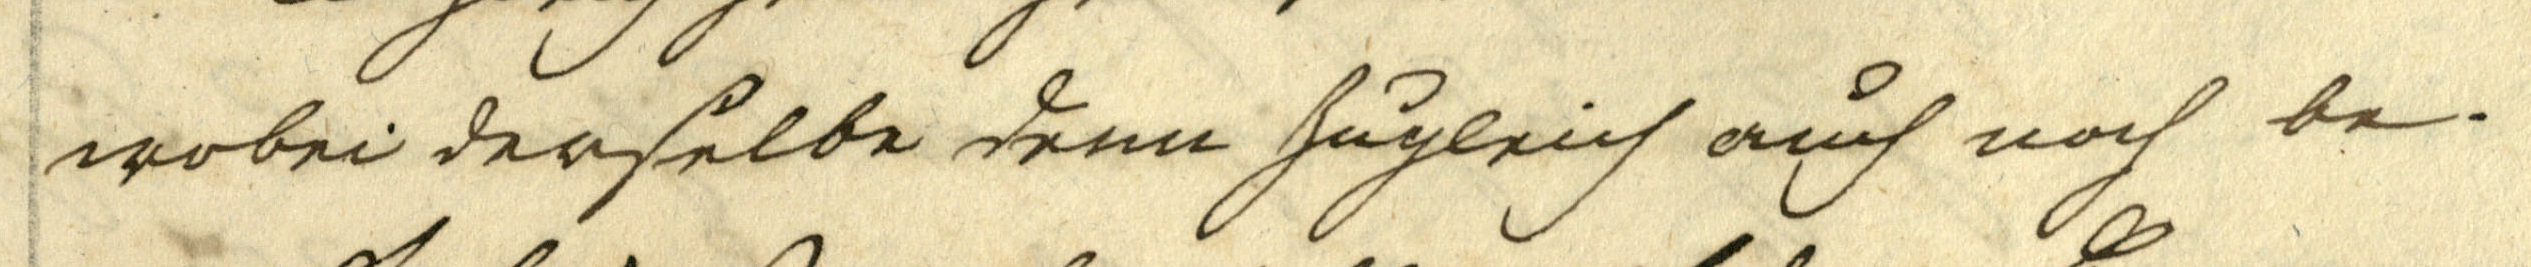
wobei derselbe denn zugleich auch noch be¬
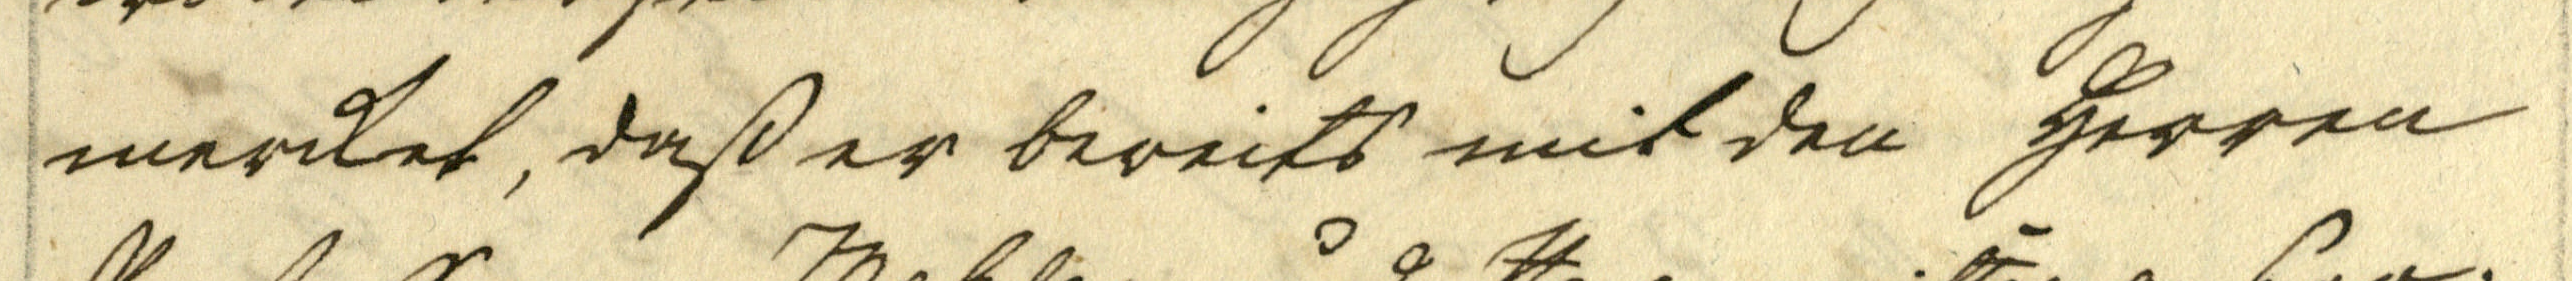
mercket, daß er bereits mit den Herren
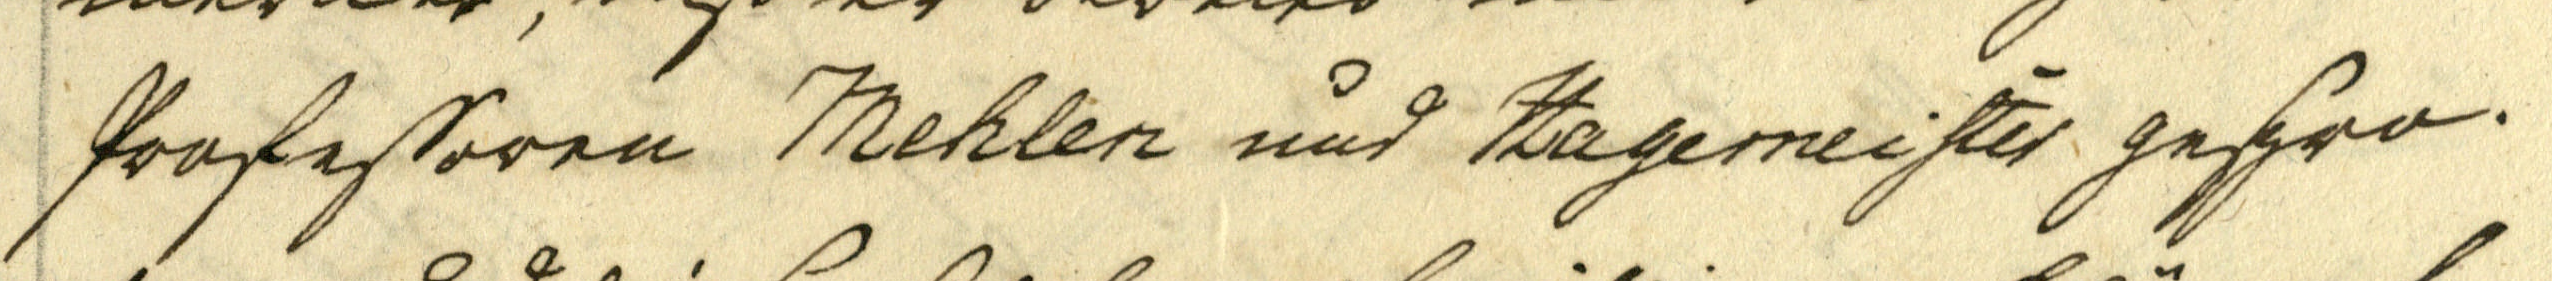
Professoren Mehlen und Hagemeister gespro¬
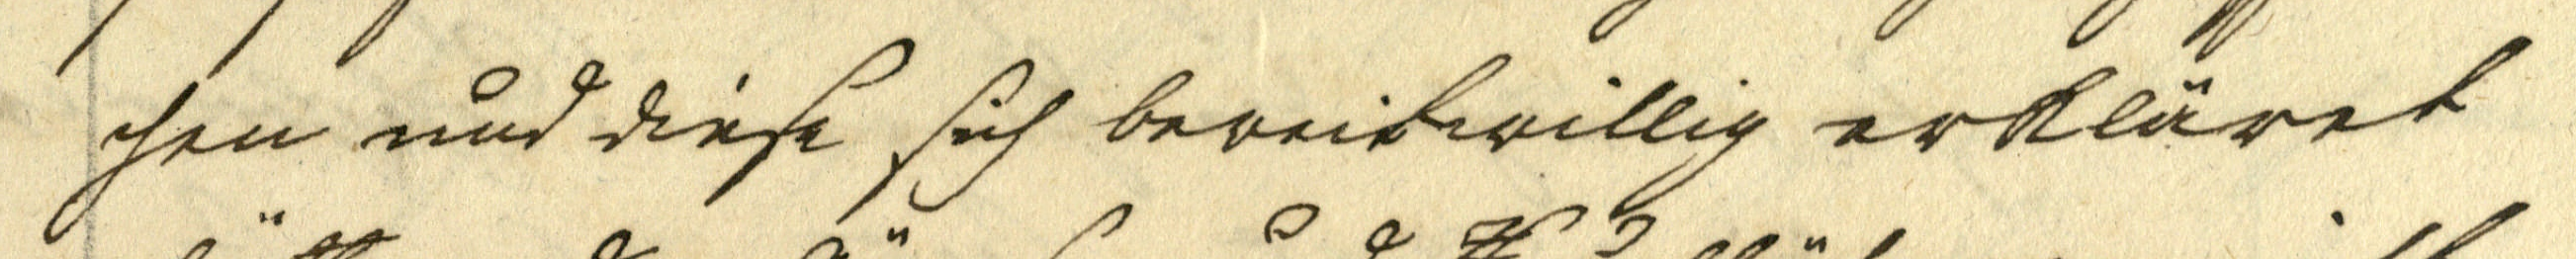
chen und diese sich bereitwillig erkläret
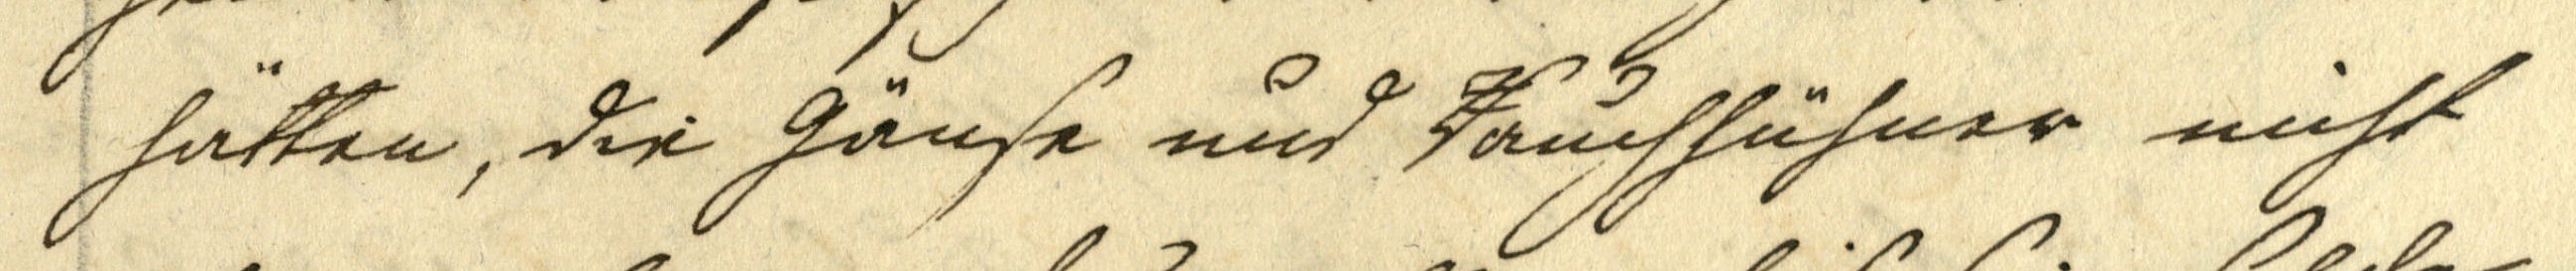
hätten, die Gänse und Rauchhühner nicht
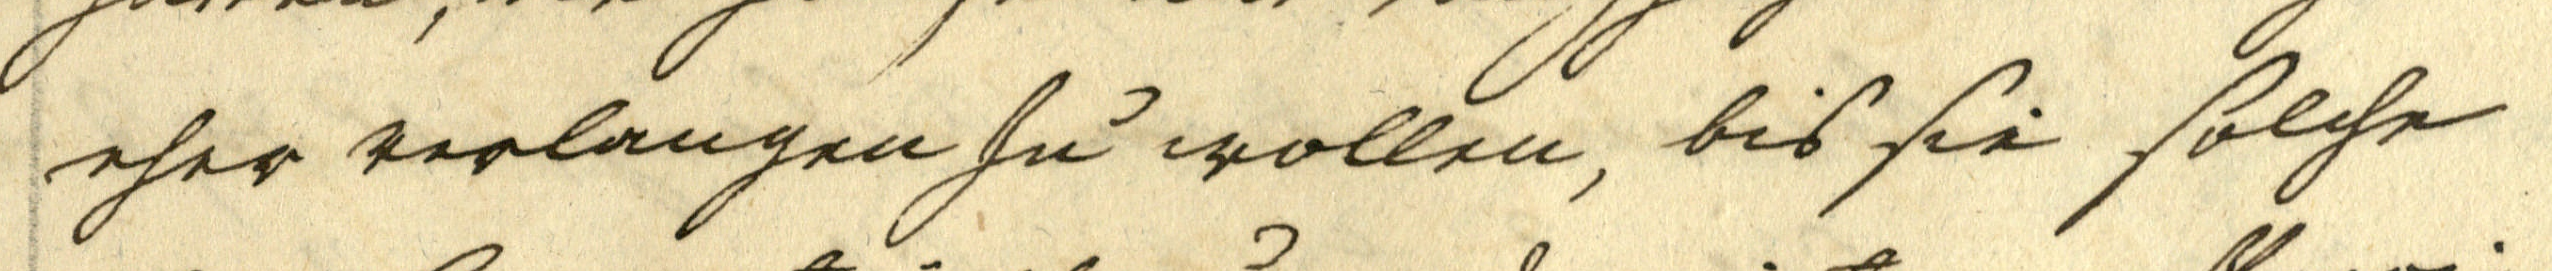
eher verlangen zu wollen, bis sie solche
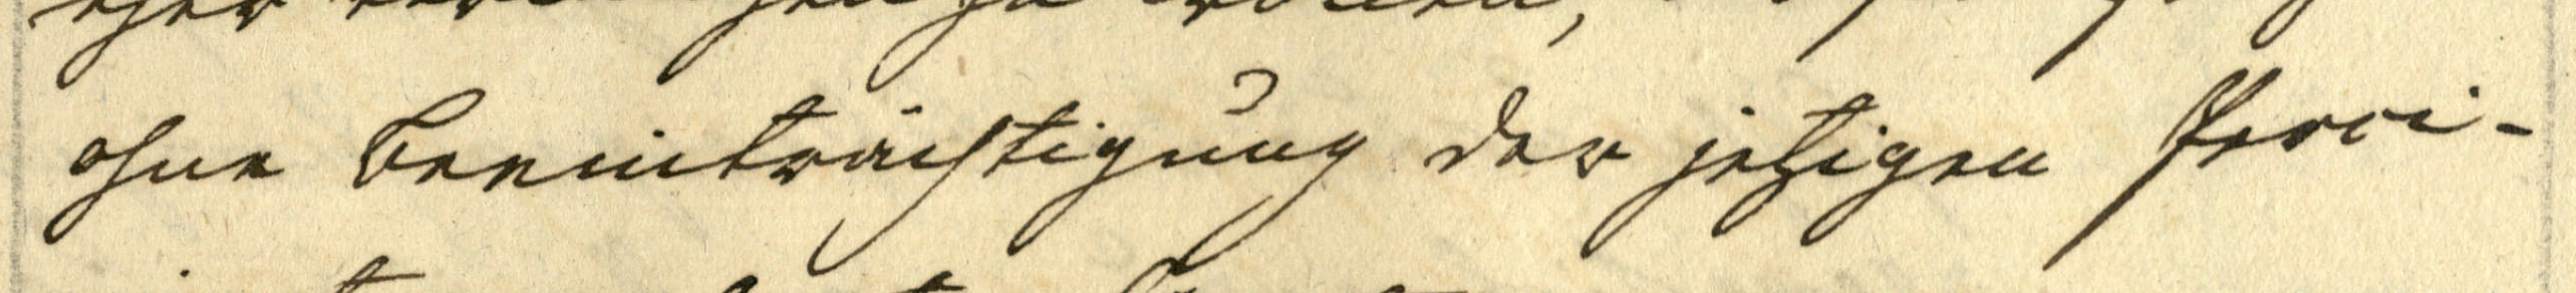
ohne Beeinträchtigung der jetzigen Perci¬
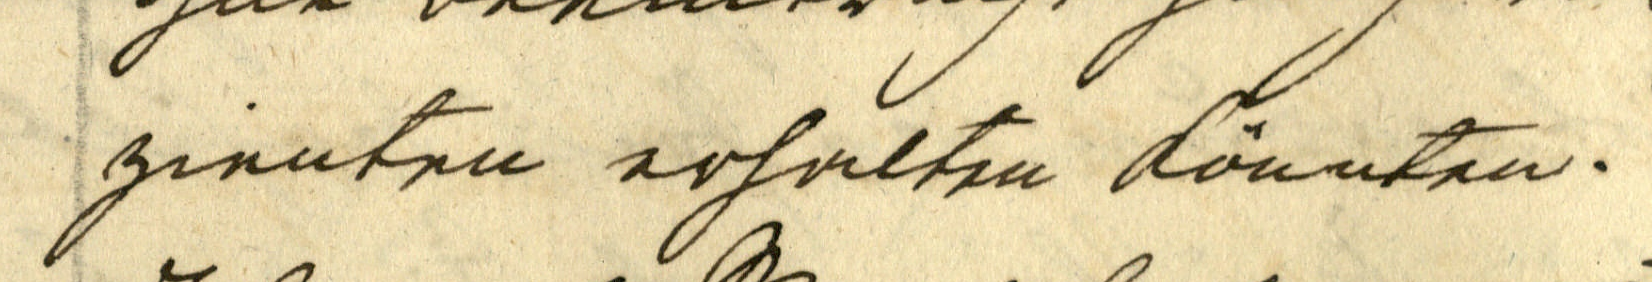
pienten erhalten könnten.
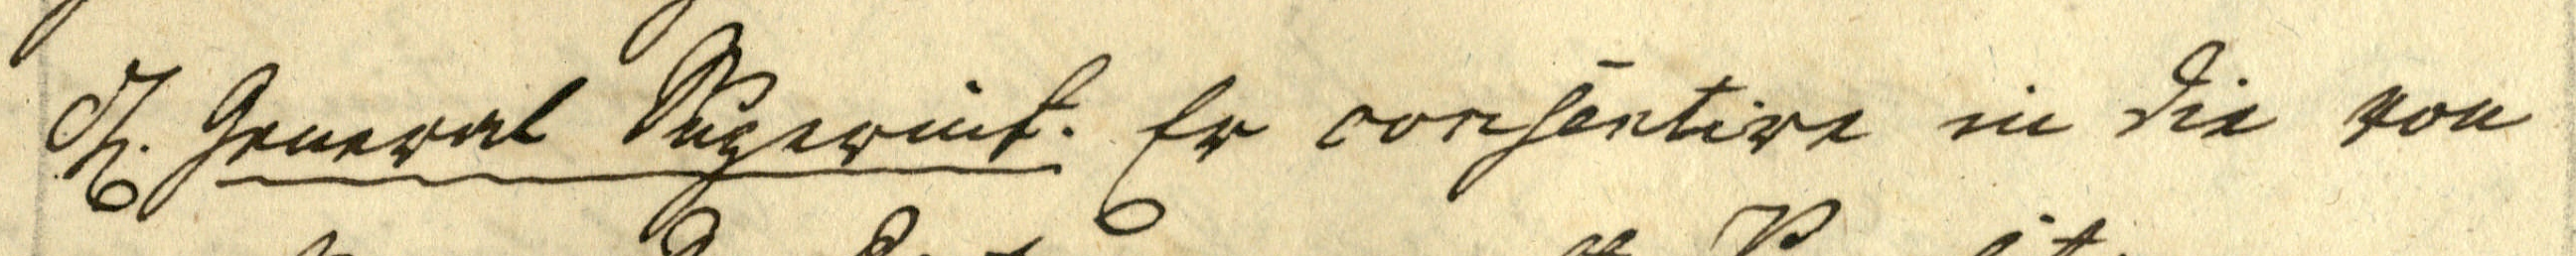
dh. General Superint. Er consentire in die von
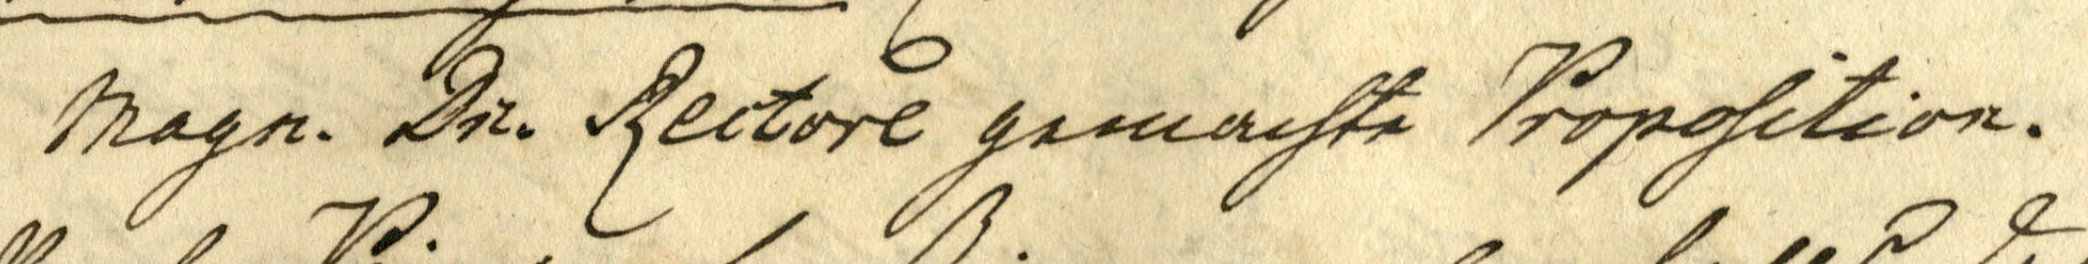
Magn. Dn. Rectore gemachte Proposition.
